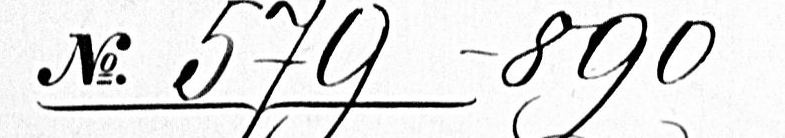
N° 579-890
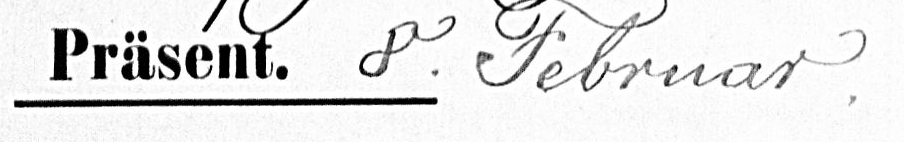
Präsent. 8. Februar.
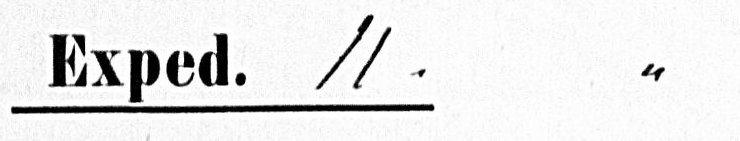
Exped. 11. Februar.
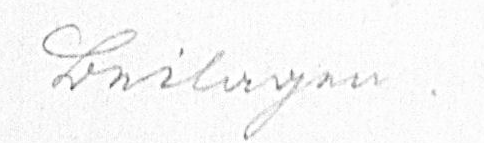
Beilagen
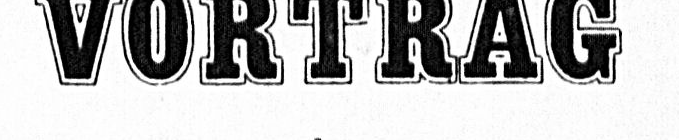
VORTRAG
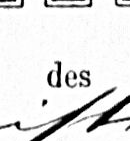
des
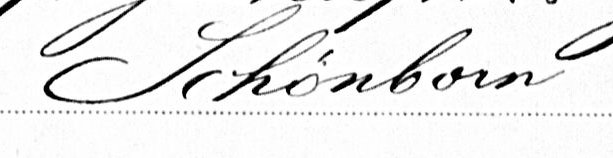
Schönborn
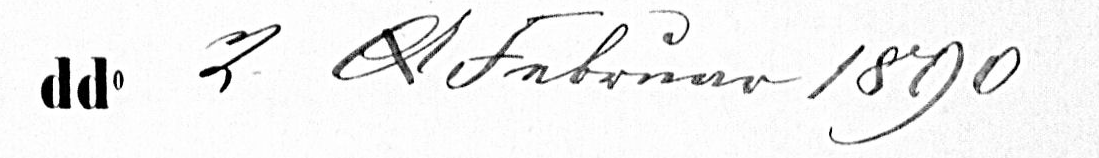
dd° 2 Februar 1890
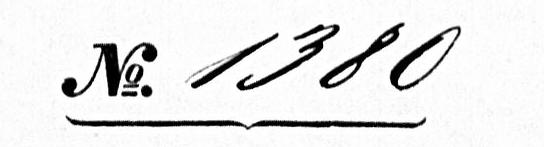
N° 1380
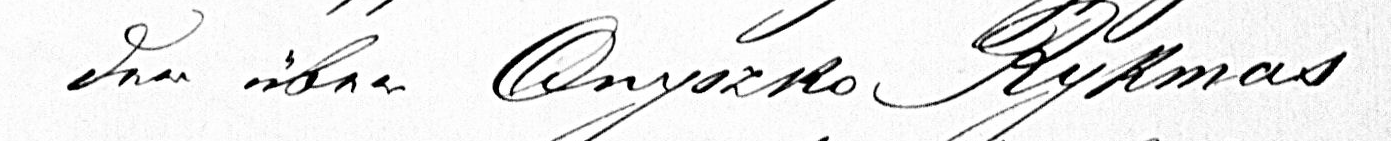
der über Onyszko Rykmas
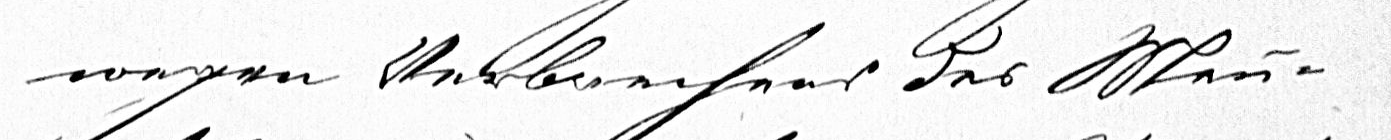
wegen Verbrechers des Meu¬
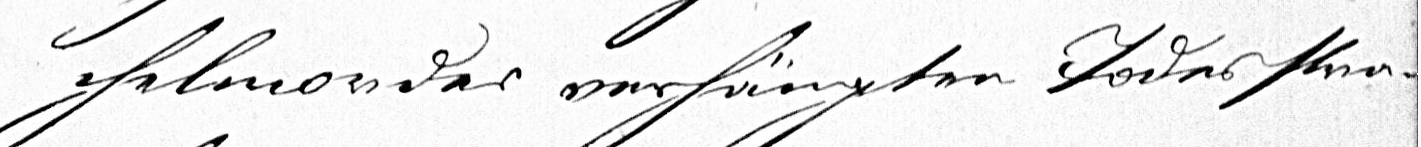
chelmordes verhängten Todesstra¬
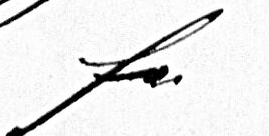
fe.
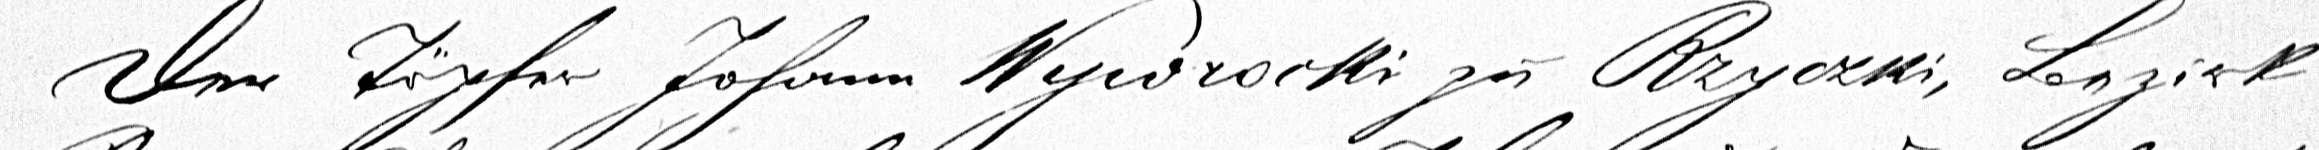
Der Töpfer Johann Wywrocki zu Rzyczki, Bezirk
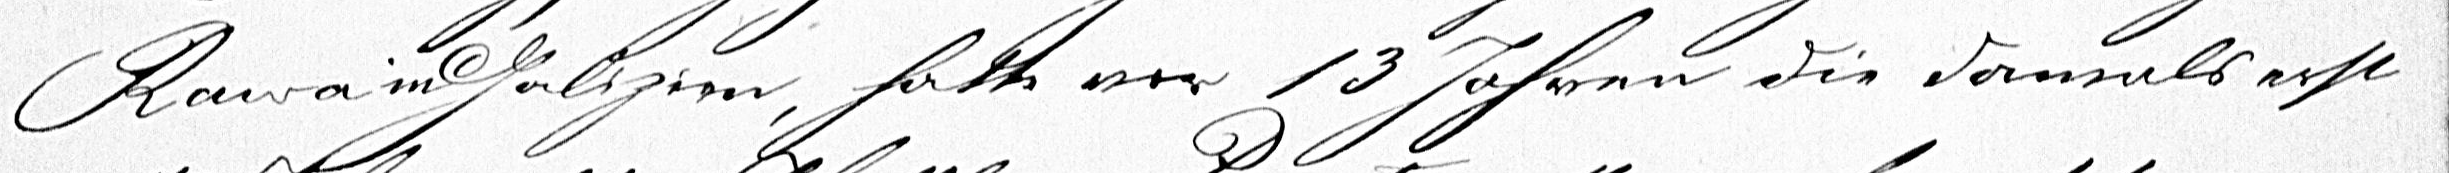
Rawam Galizien, hatte vor 13 Jahren die damals erst
